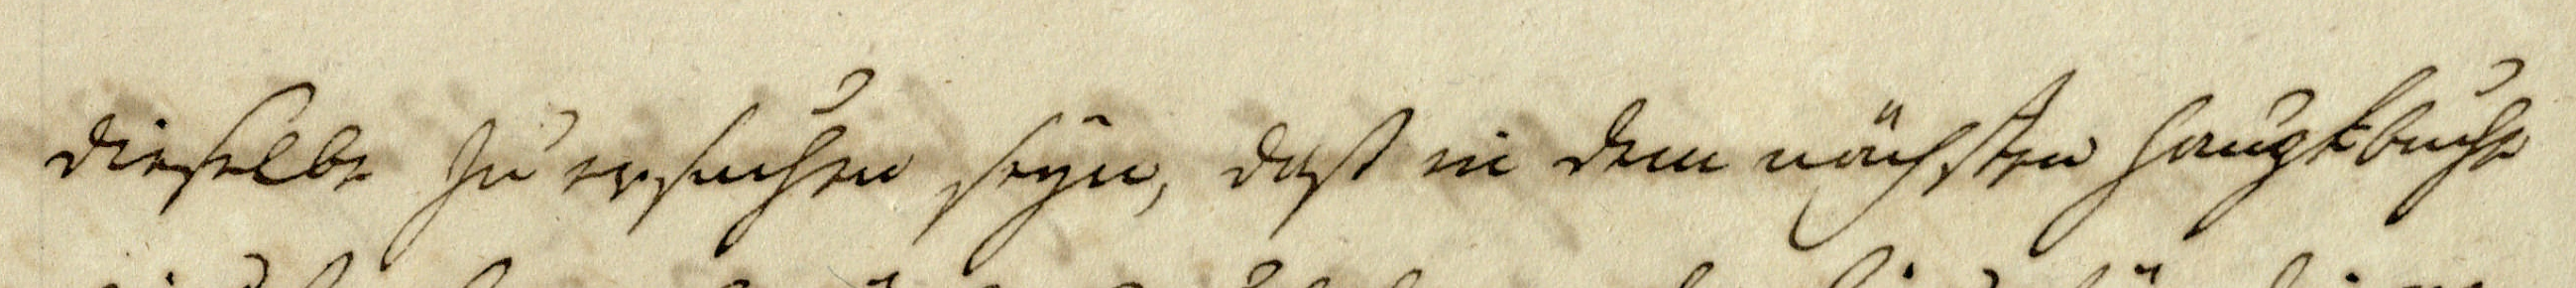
dieselbe zu ersuchen seÿn, daß in dem nächsten Hauptbuche
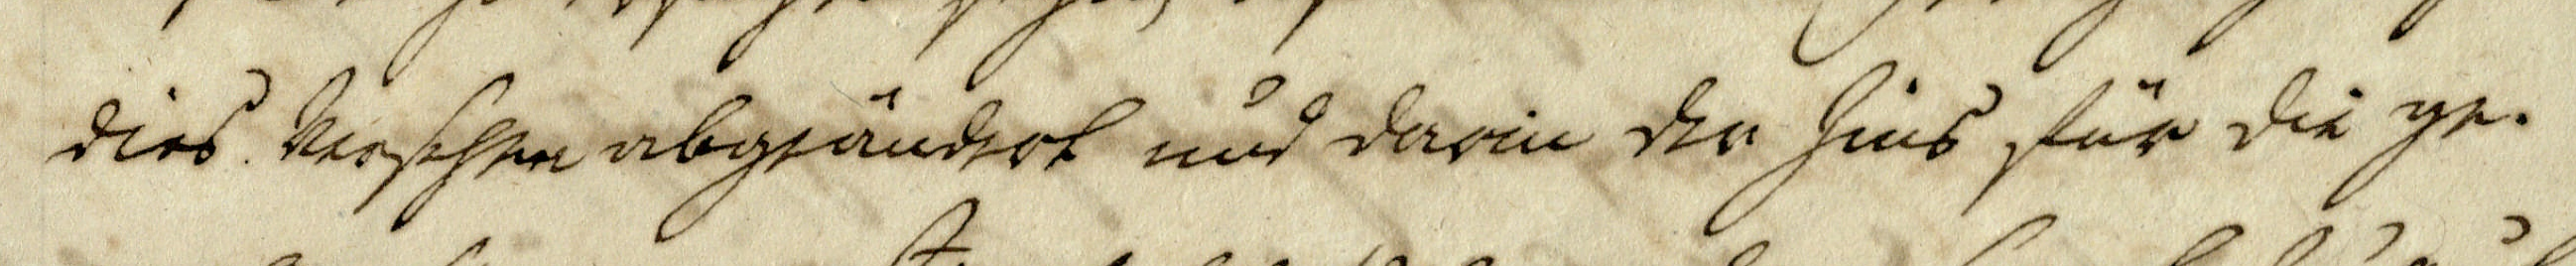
dies Versehen abgeändert und darin der Zins für die ge¬
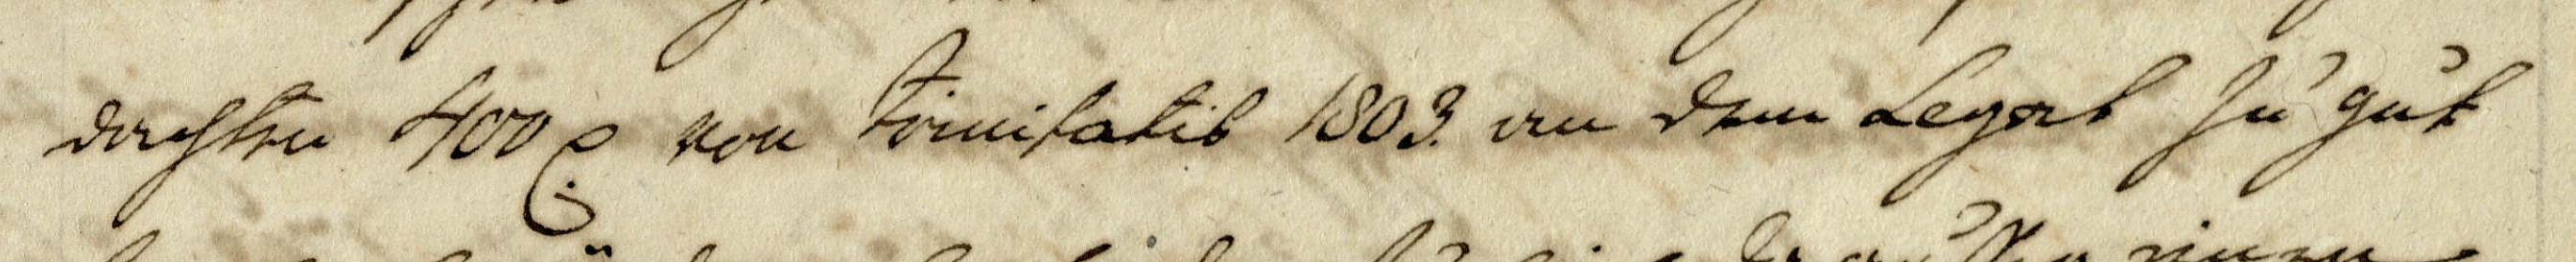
dachten 400 l. von Trinitatis 1803. an dem Legat zu gut
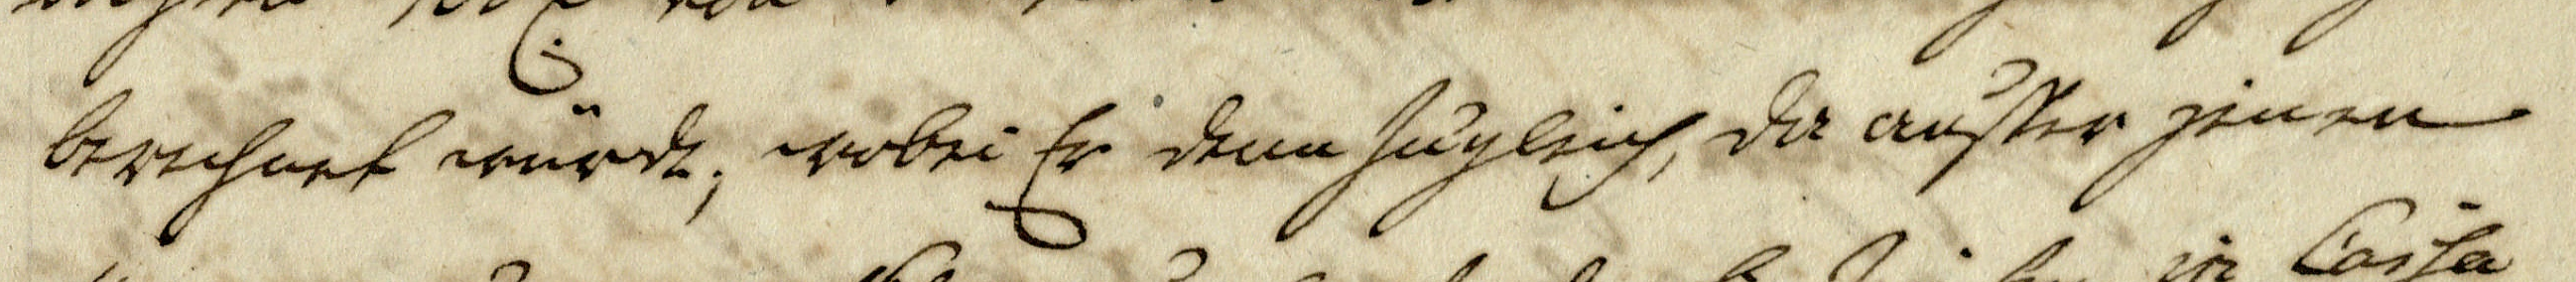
berechnet würde, wobei Er denn zugleich, da ausser jenen
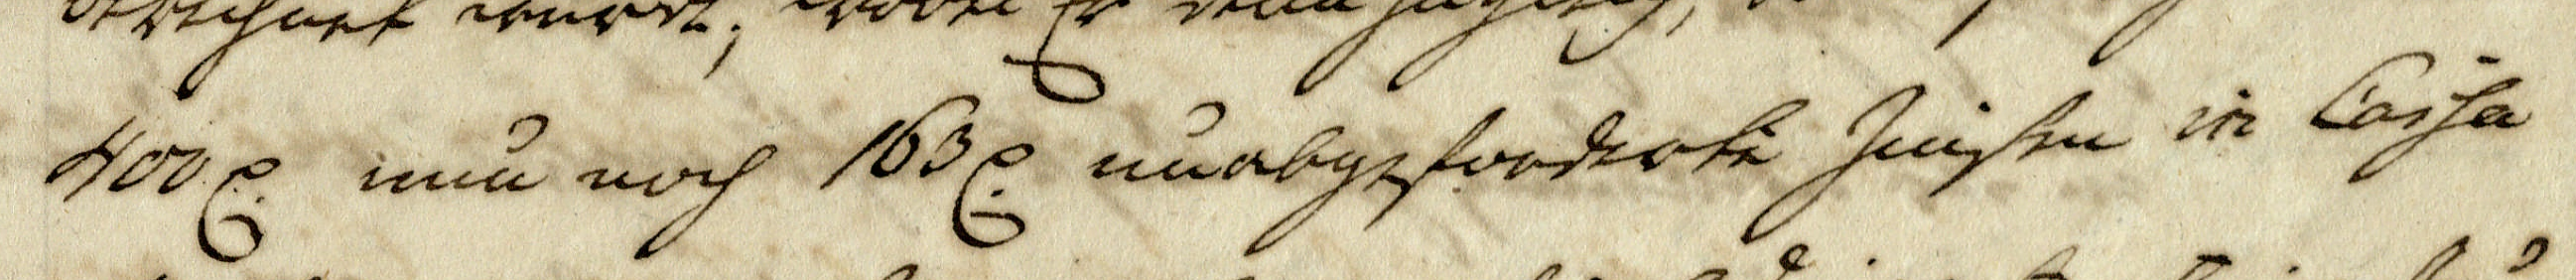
400 l. nun noch 163 l. unabgefordert Zinsen in Cassa
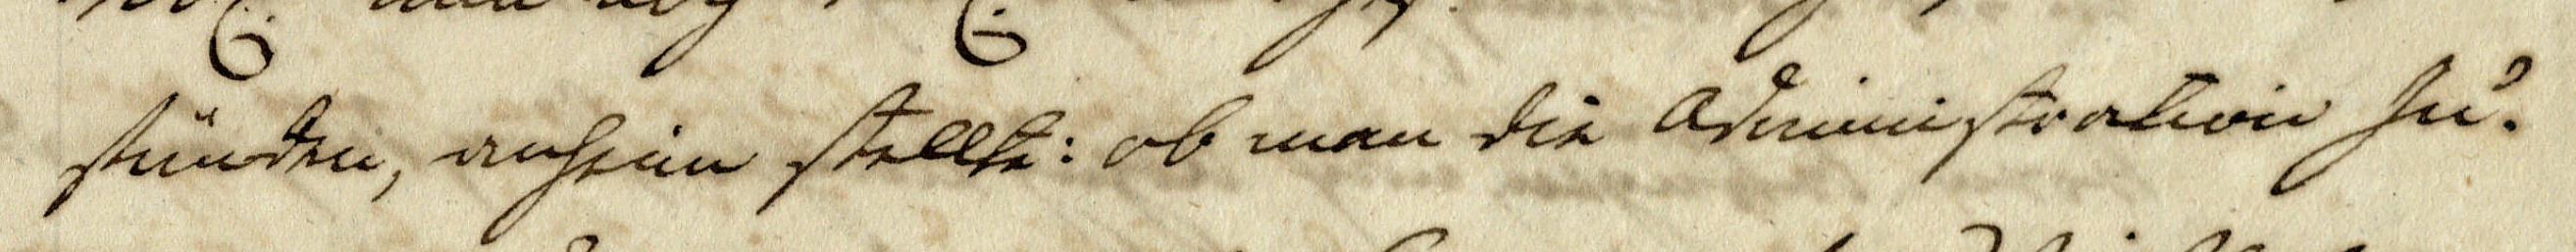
stünden, anheim stellte: ob man die Administration zu¬
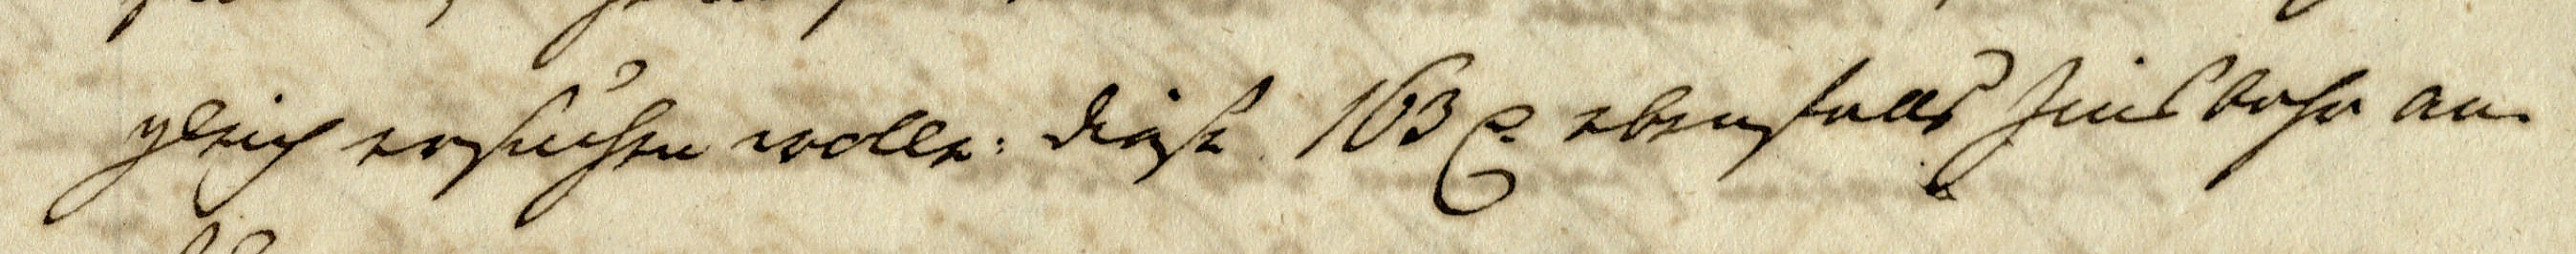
gleich ersuchen wolle, diese 163 l. ebenfalls zinsbahr an¬
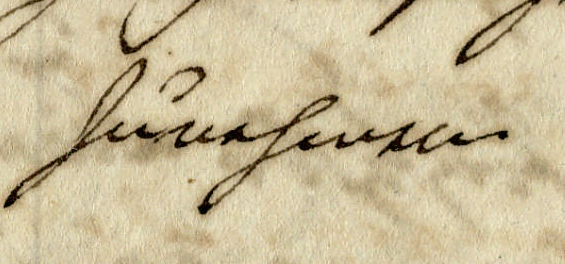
zunehmen.
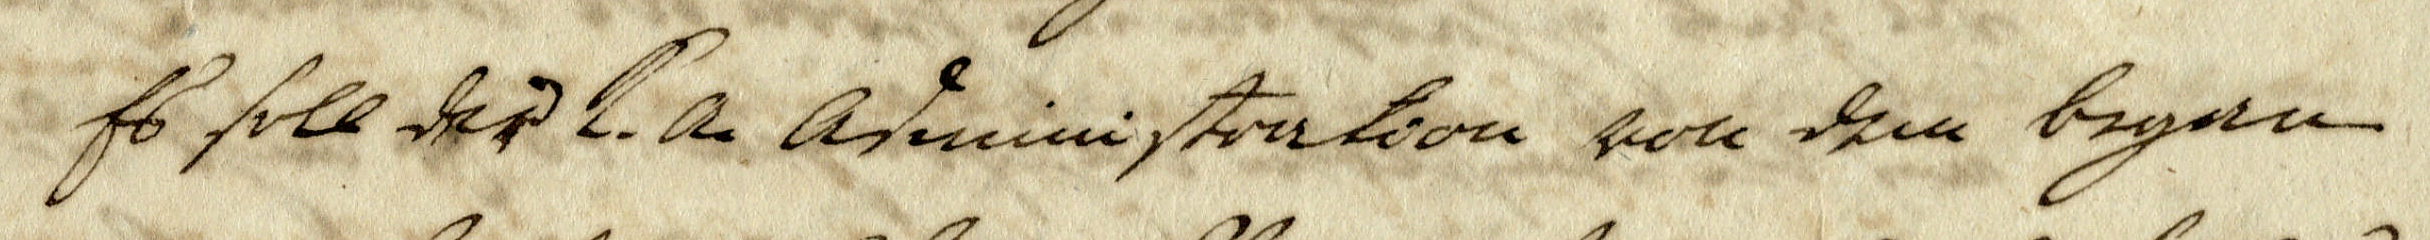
Es soll der K. A. Administration von dem began¬
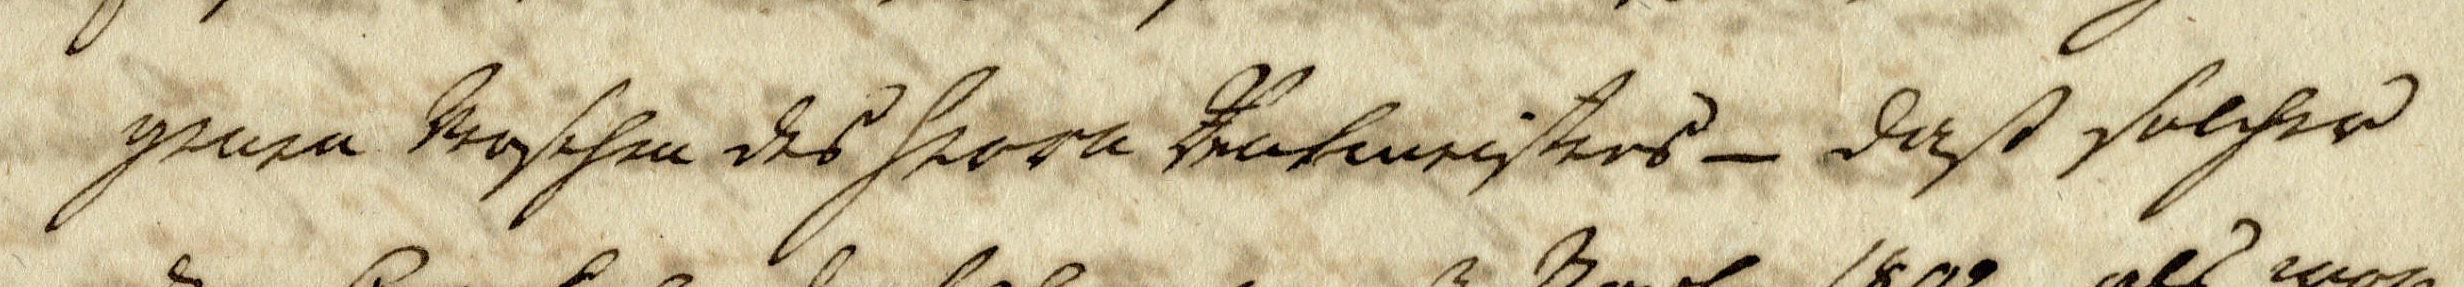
genen Versehen des Herrn Rentmeisters - daß solcher
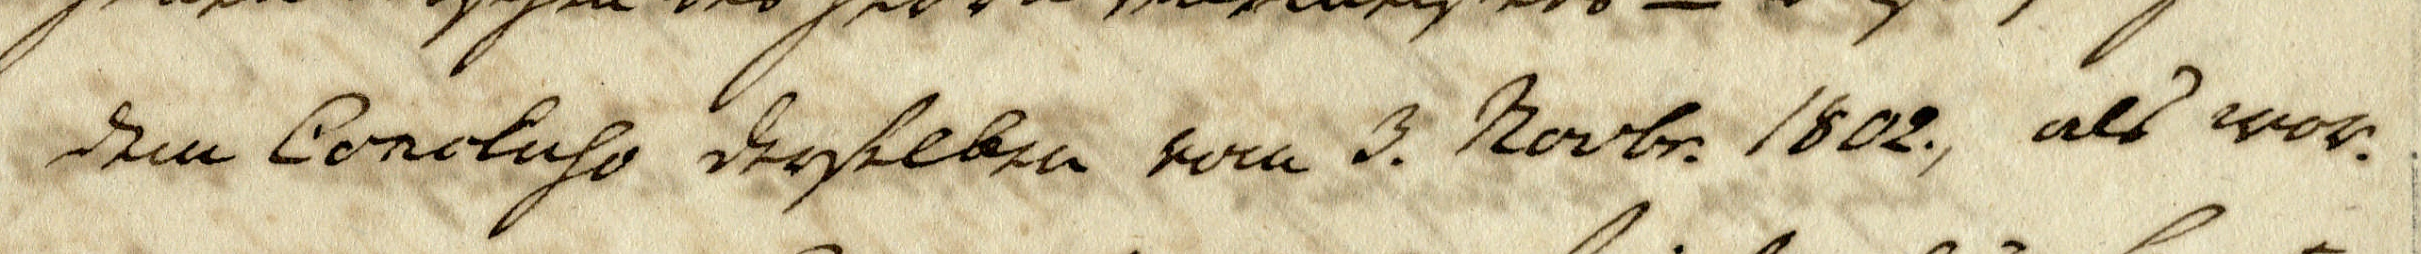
dem Concluso derselben vom 3. Novbr. 1802., als wor¬
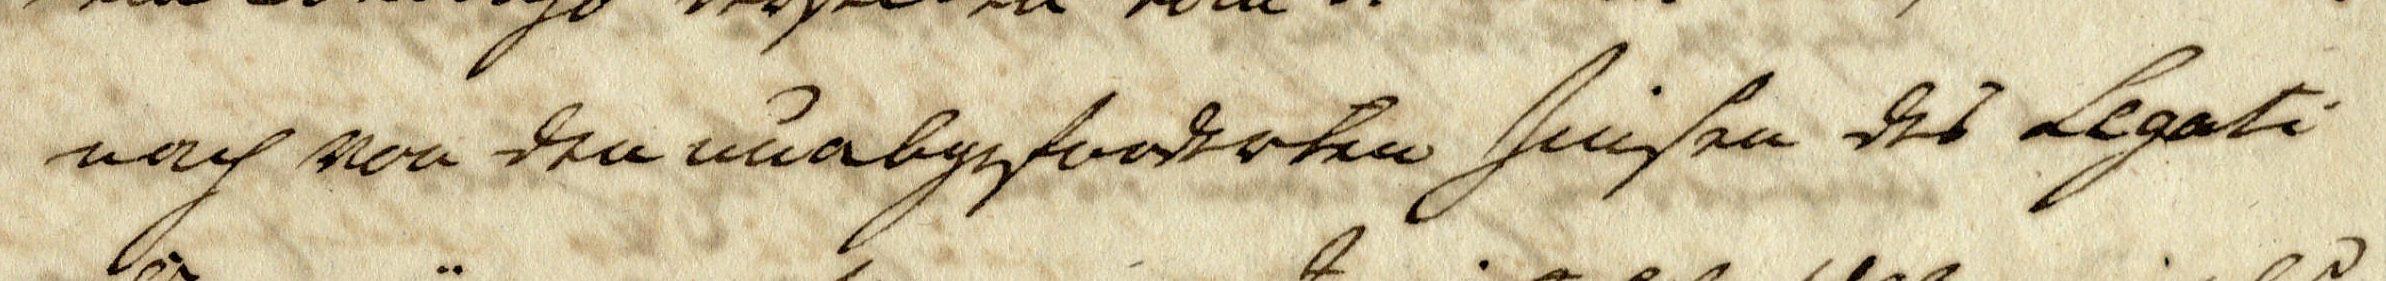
nach von den unabgeforderten Zinsen des Legati
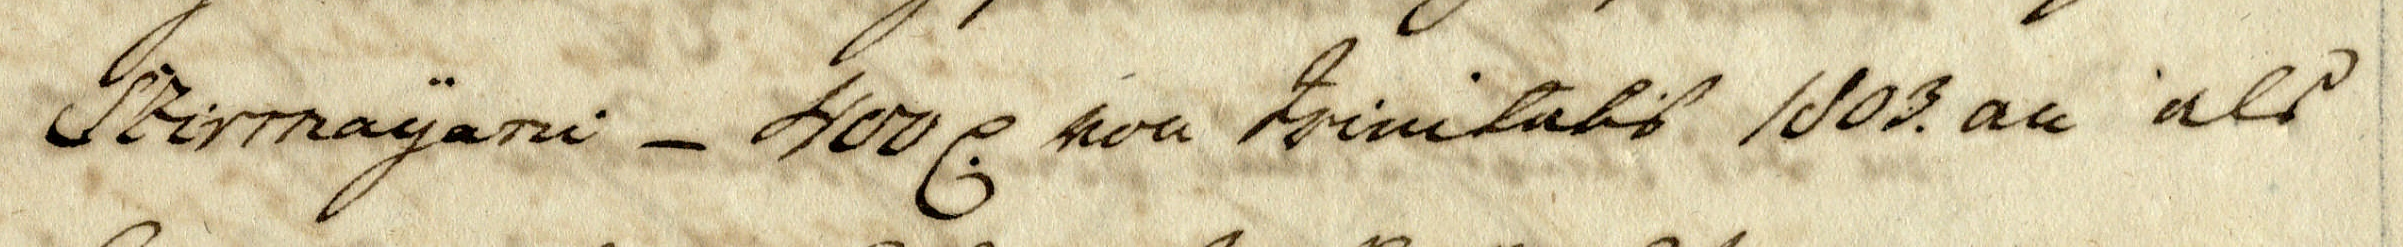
Szirmayani - 400 l. von Trinitatis 1803. an als
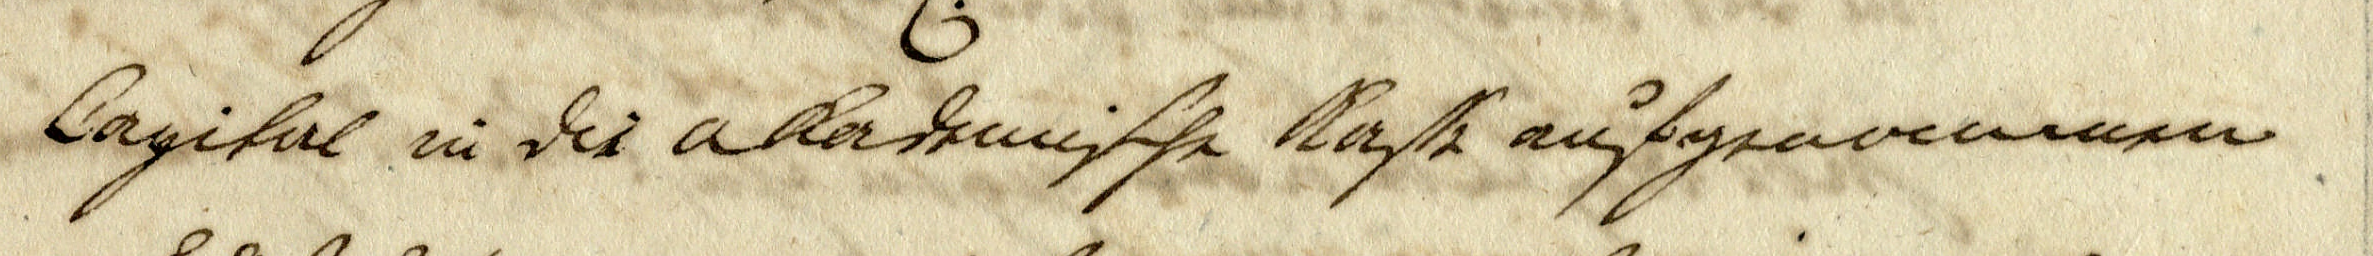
Capital in die akademische Kasse aufgenommen
